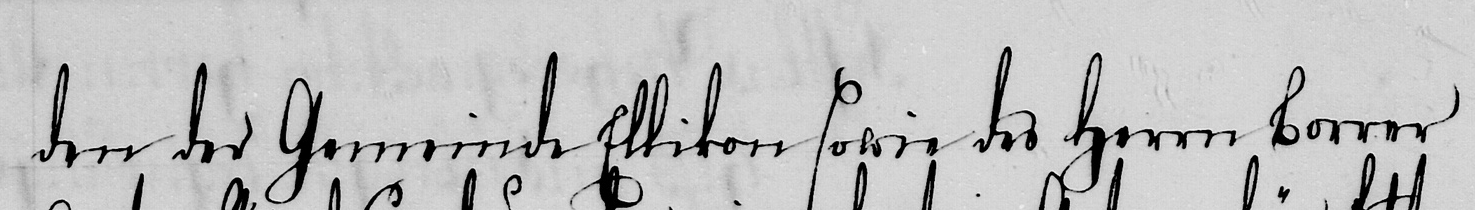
den der Gemeinde Ellikon sowie des Herrn Borrer
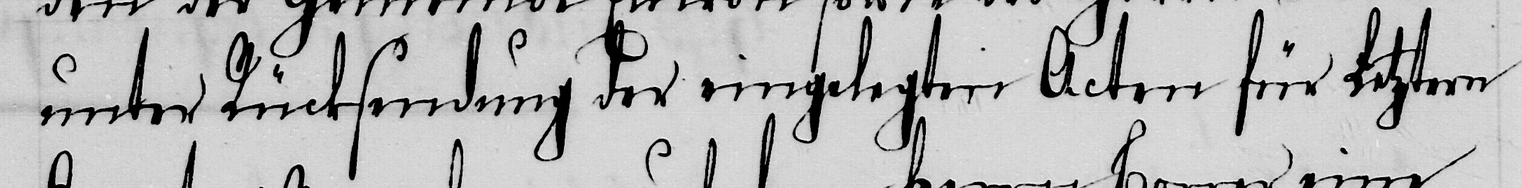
unter Rücksendung der eingelegten Acten für Letztern
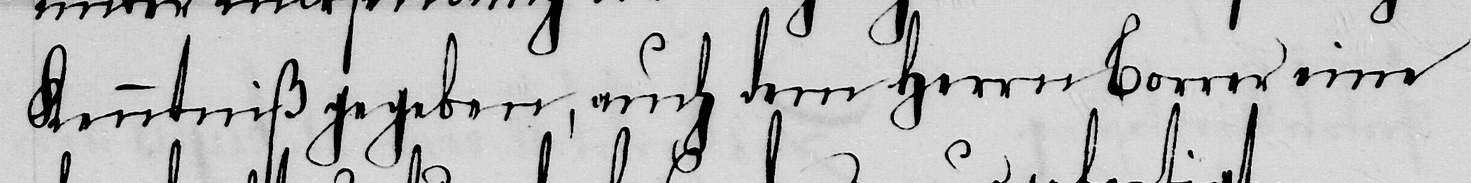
Kenntniß gegeben, auch dem Herrn Borrer eine
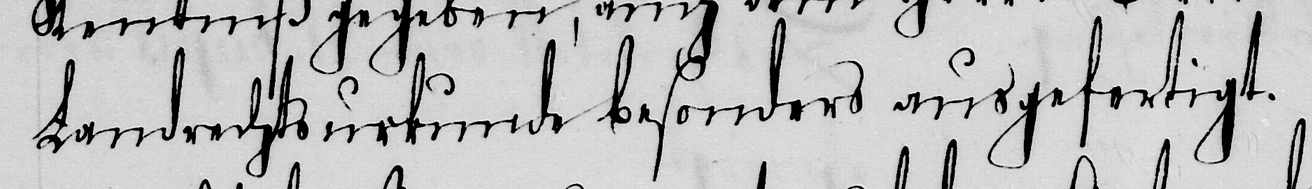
Landrechtsurkunde besonders ausgefertigt.
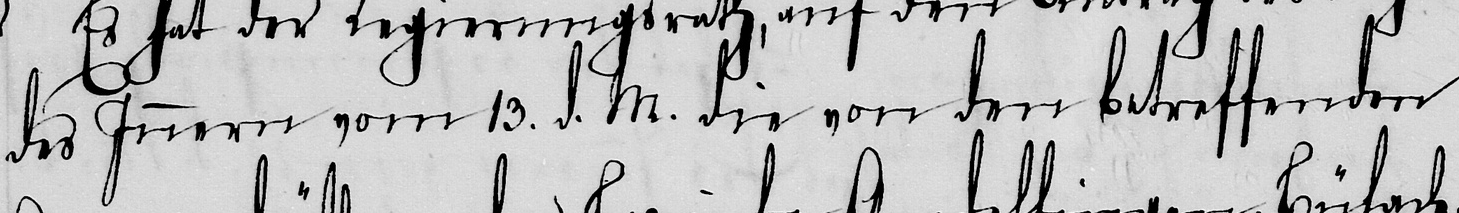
des Innern vom 13. d. M. die von den betreffenden
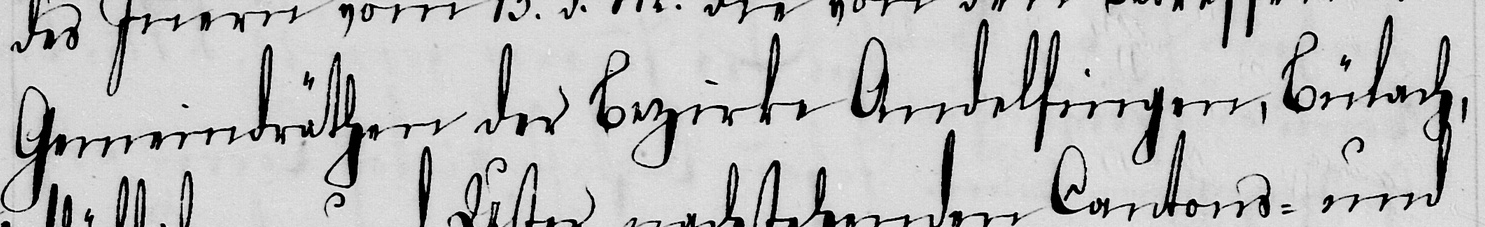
Gemeindräthen der Bezirke Andelfingen, Bülach,
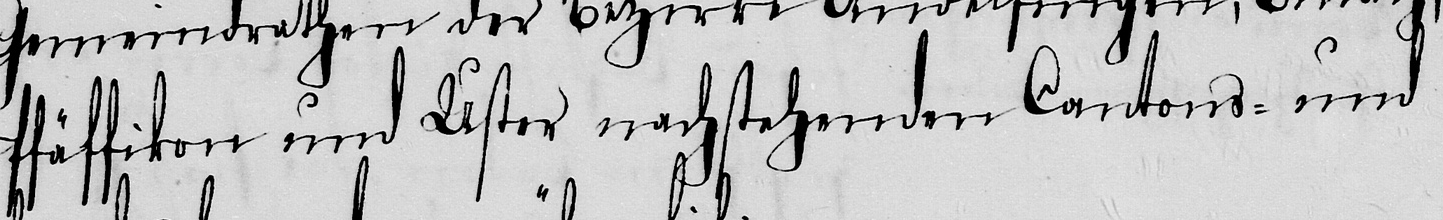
Pfäffikon und Uster nachstehenden Cantons- und
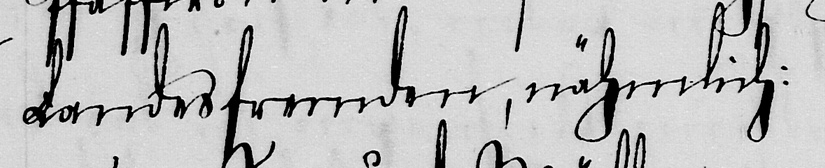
Landesfremden, nähmlich:
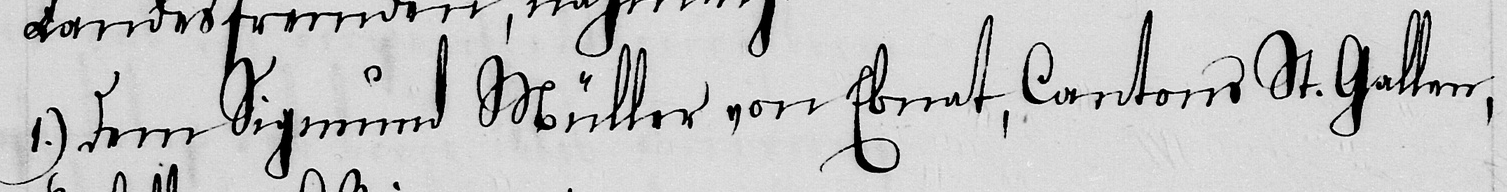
1.) Dem Sigmund Müller von Ebnat, Cantons St. Gallen,
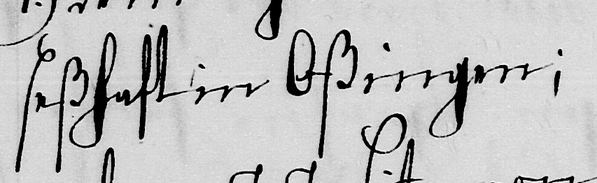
seßhaft in Oßingen;
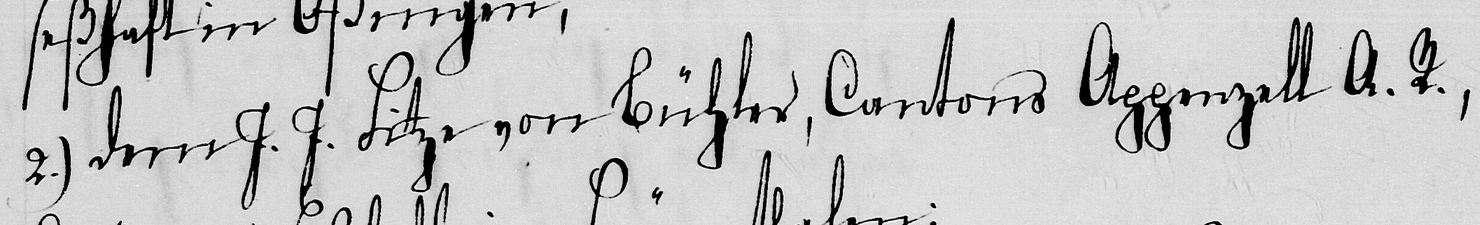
2.) dem J. J. Fitze von Bühler, Cantons Appenzell A. R.,
